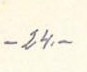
24
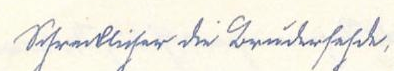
Schrecklicher die Bruderfehde,
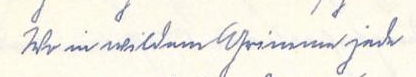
wo in wildem Grimmen jede
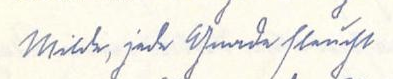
Milde, jede Gnade fleucht
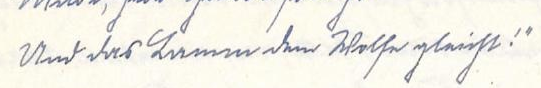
Und das Lamme dem Wolfe gleicht!“
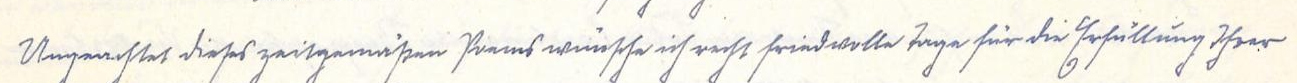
Ungeachtet dieses zeitgemäßen Poems wünsche recht friedvolle Tage für die Erfüllung Ihrer
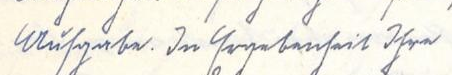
Aufgabe. In Ergebenheit Ihre
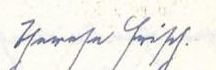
Therese Frisch
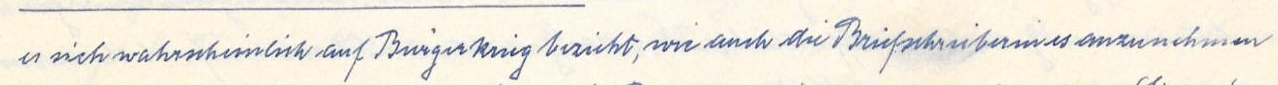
es sich wahrscheinlich auf Bürgerkrieg bezieht, wie auch die Briefschreiberin anzunehmen
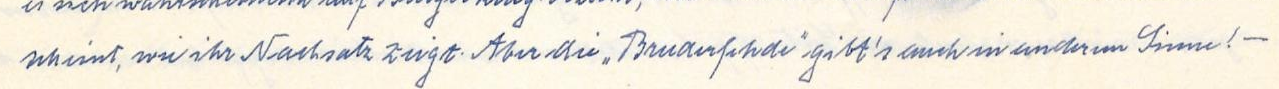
scheint, wie ihr Nachsatz zeigt. Aber die „Bruderfehde“ gibt’s auch in anderem Sinne! –
